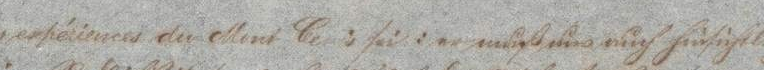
des expériences du Mont Cenis sei: er muss uns auch hinsichtlich
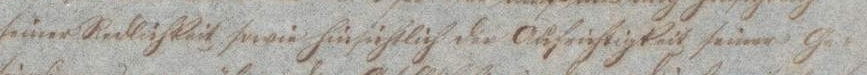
seiner Redlichkeit sowie hinsichtlich der Aufrichtigkeit seiner Ge-
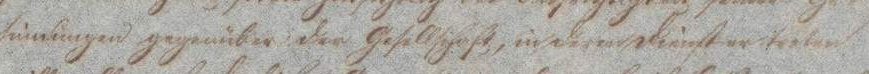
sinnungen gegenüber der Gesellschaft, in deren Dienst er treten
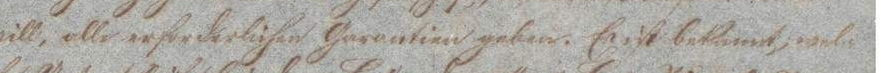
will, alle erforderlichen Garantien geben. Es ist bekannt, wel-
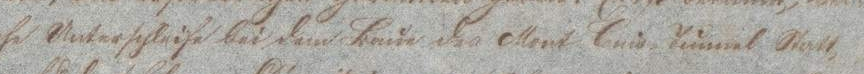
che Unterschleife bei dem Baue des Mont Cenis-Tunnel Statt
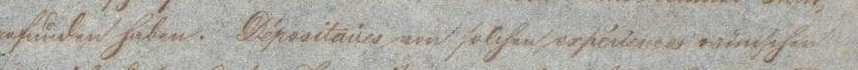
gefunden haben. Dépositaires von solcher expériences wünschen
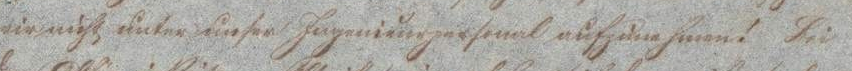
wir nicht unter unser Ingenieurpersonal aufzunehmen! Bei
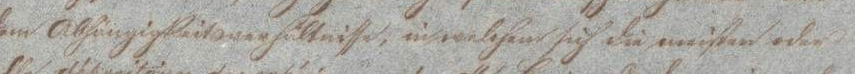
dem Abhängigkeitsverhältnisse, in welchem sich die meisten oder
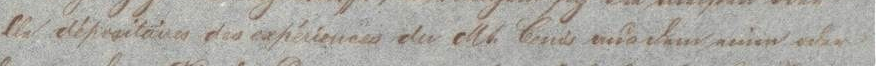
alle dépositaires des expériences du Mt. Cenis aus dem einen oder
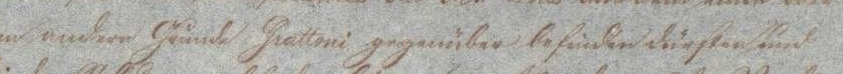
dem andern Grunde Grattoni gegenüber befinden dürften und
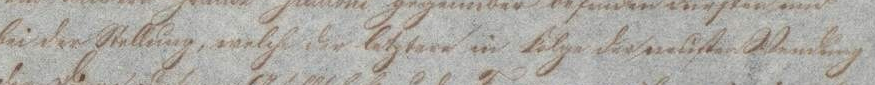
bei der Stellung, welche der letztere in Folge der neusten Wendung
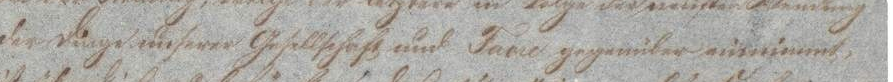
der Dinge unserer Gesellschaft und Favre gegenüber einnimmt,
